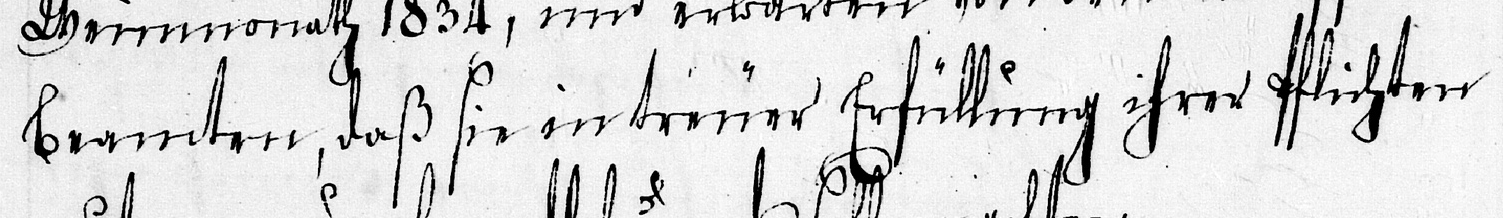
Beamten, daß sie in treuer Erfüllung ihrer Pflichten
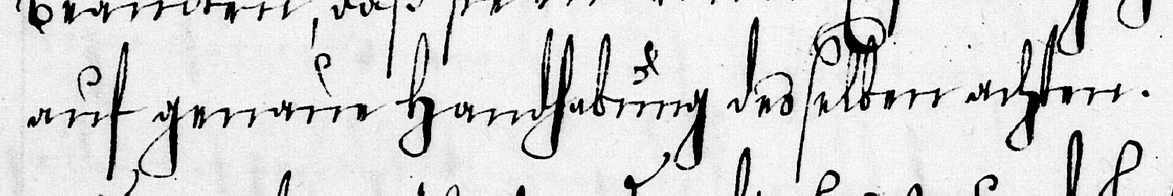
auf genaue Handhabung desselben achten.
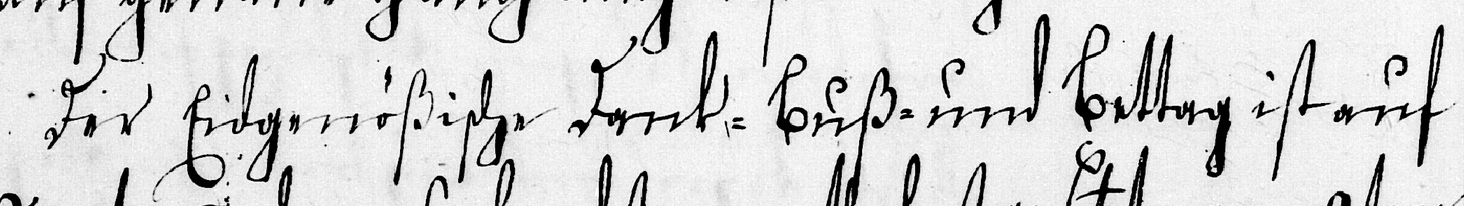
Der Eidgenößische Dank- Buß- und Bettag ist auf
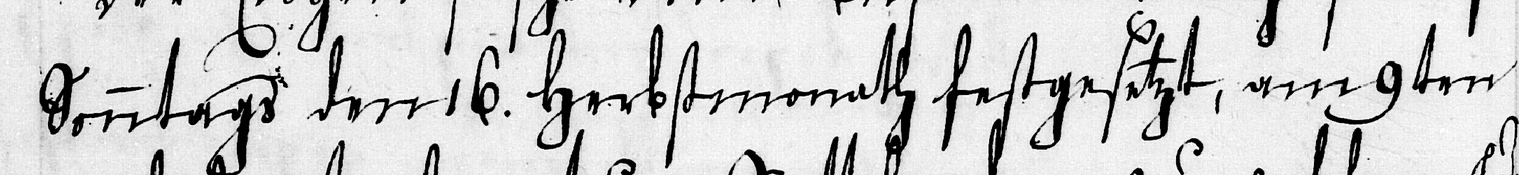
Sonntags den 16. Herbstmonath festgesetzt, am 9ten
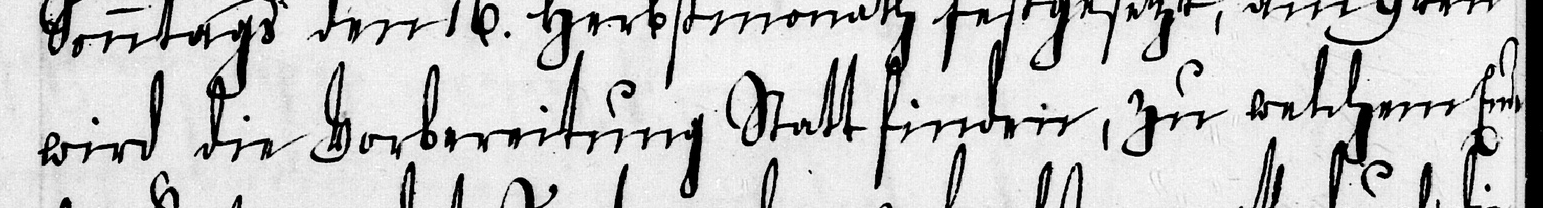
wird die Vorbereitung Statt finden, zu welchem Ende
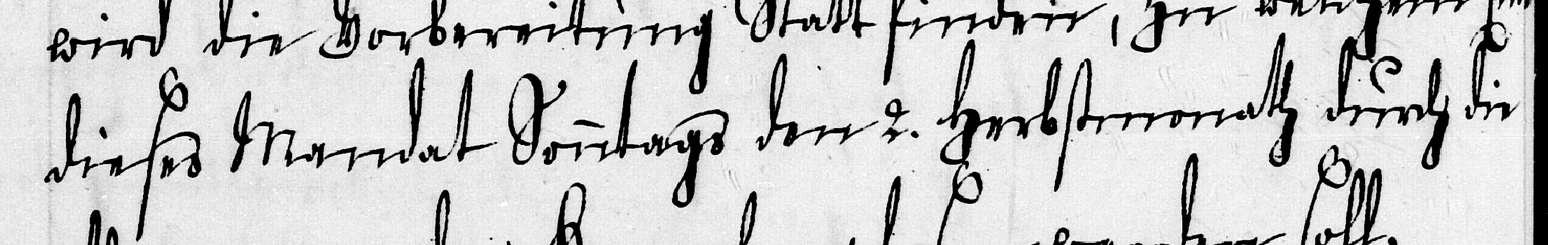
dieses Mandat Sonntags den 2. Herbstmonath durch die
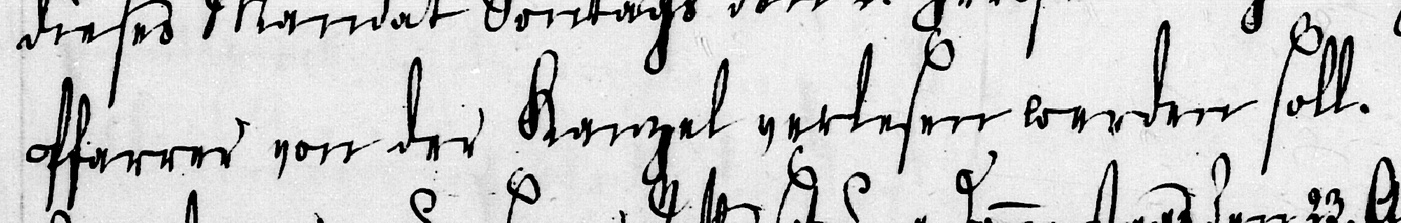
Pfarrer von der Kanzel verlesen werden soll.
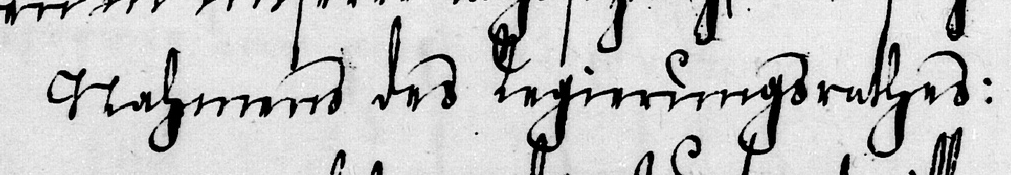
Nahmens des Regierungsrathes:
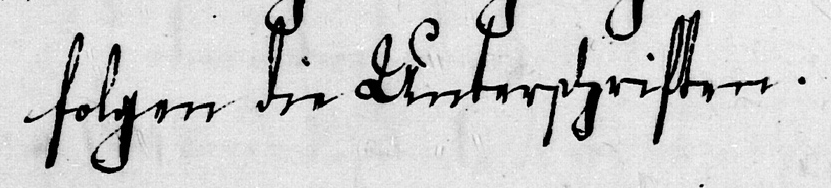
folgen die Unterschriften.
